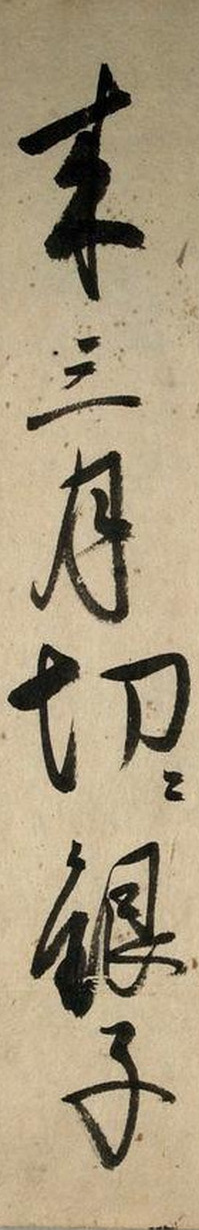来三月切に銀子
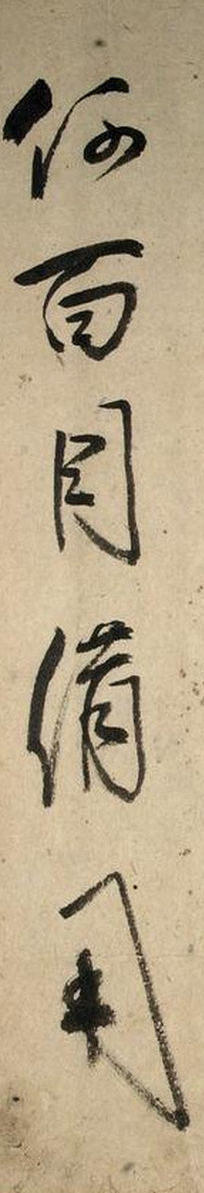何百目借用

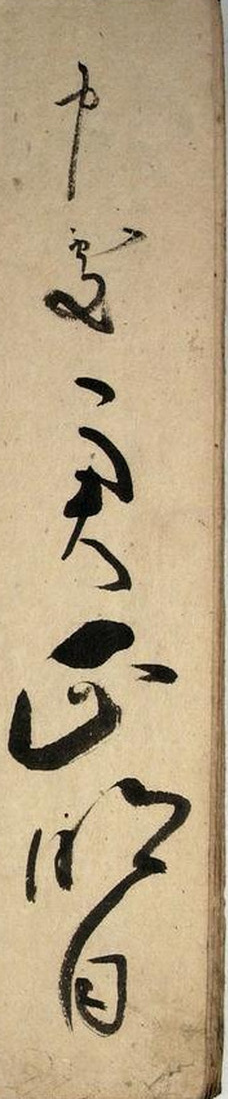申処実正明白
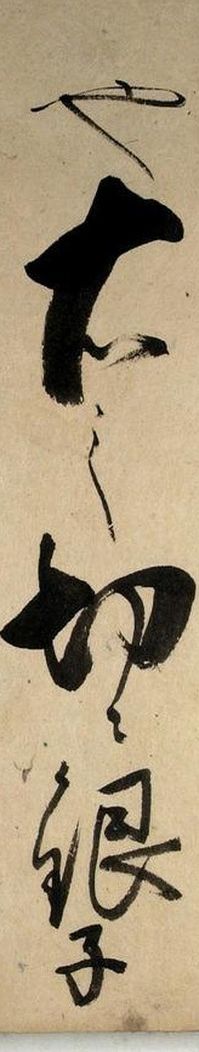也右之切に銀子
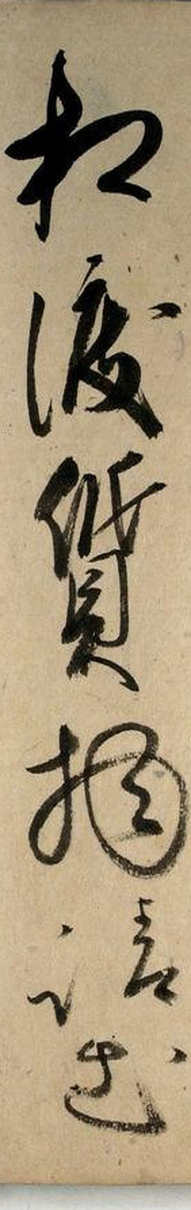相渡質物請出
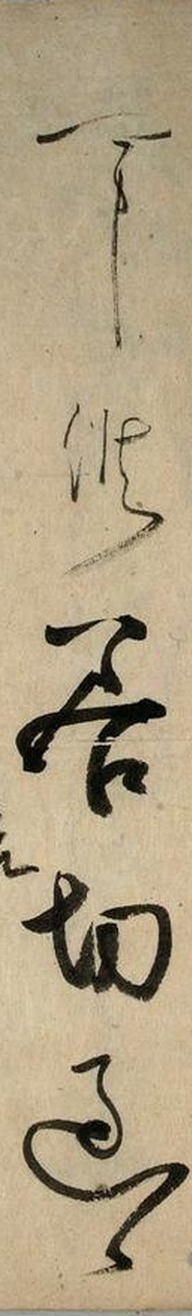可申候若切過候
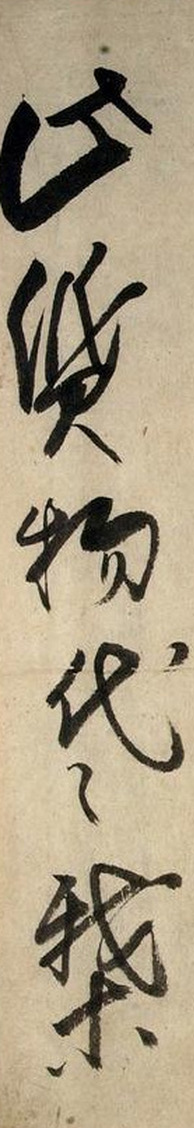此質物代々我等

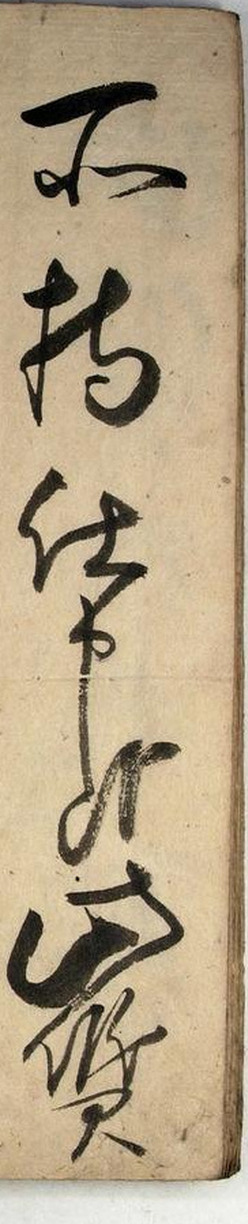所持仕申候此質
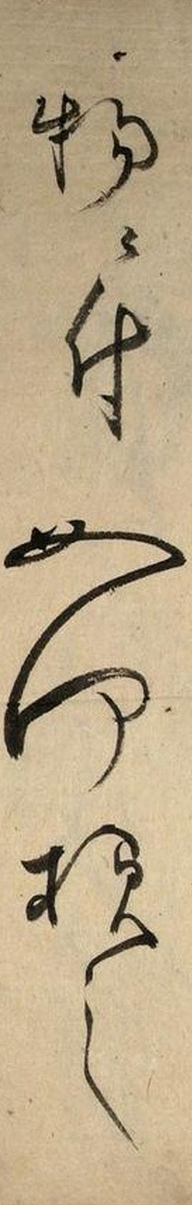物に付如何様之
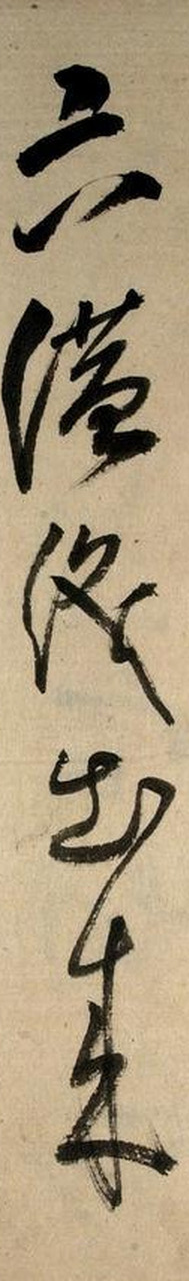六借儀出来
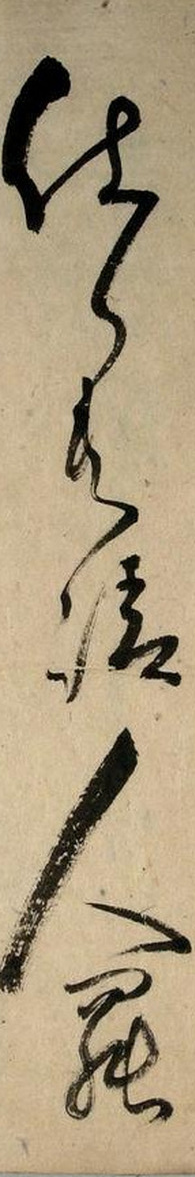仕候共請人罷
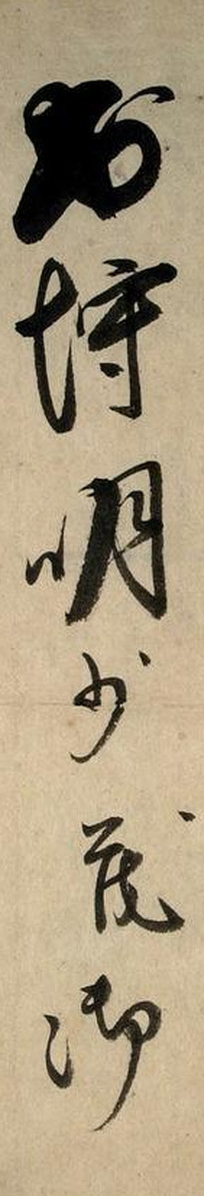出埒明少も御
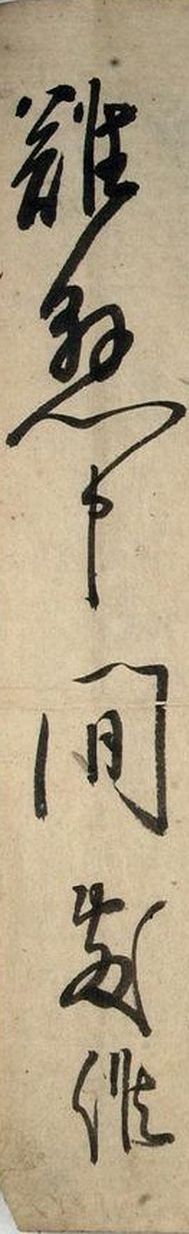難懸申間敷候

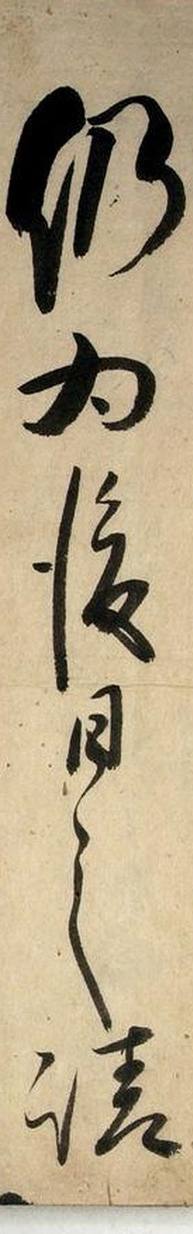仍為後日之請
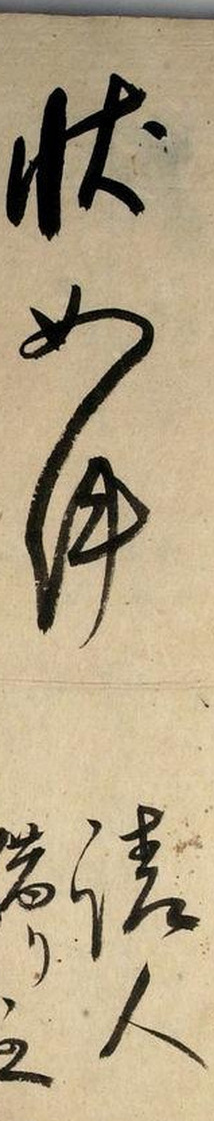状如件請人
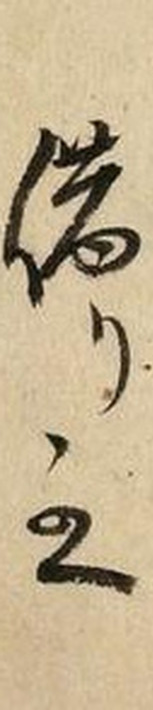借り主
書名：御手本（手習、預リ申銀子之事、売渡申家屋敷事ほか）
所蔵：福井県文書館 Fukui Prefectural Archives
